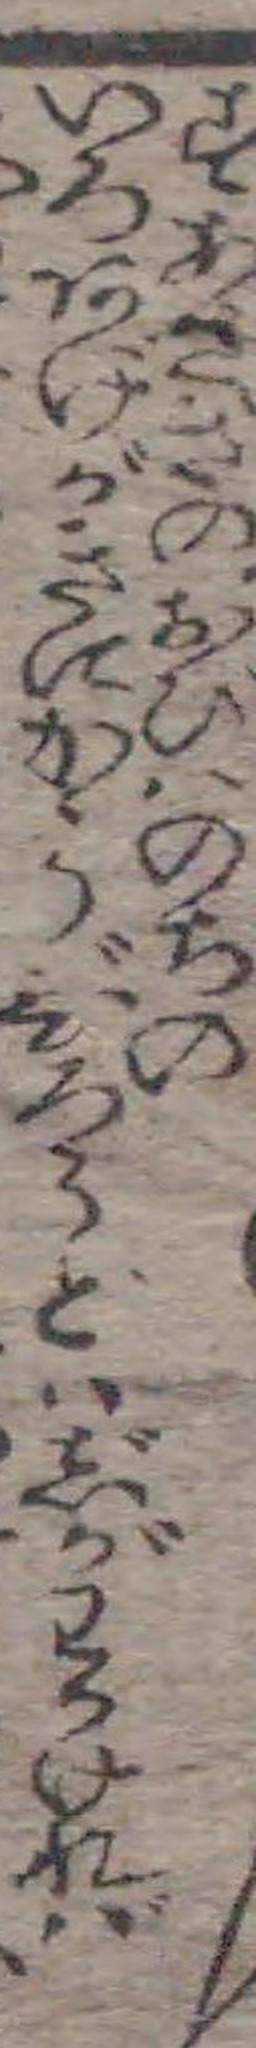いろあげがきにかゝりびろうとはじがわかければ
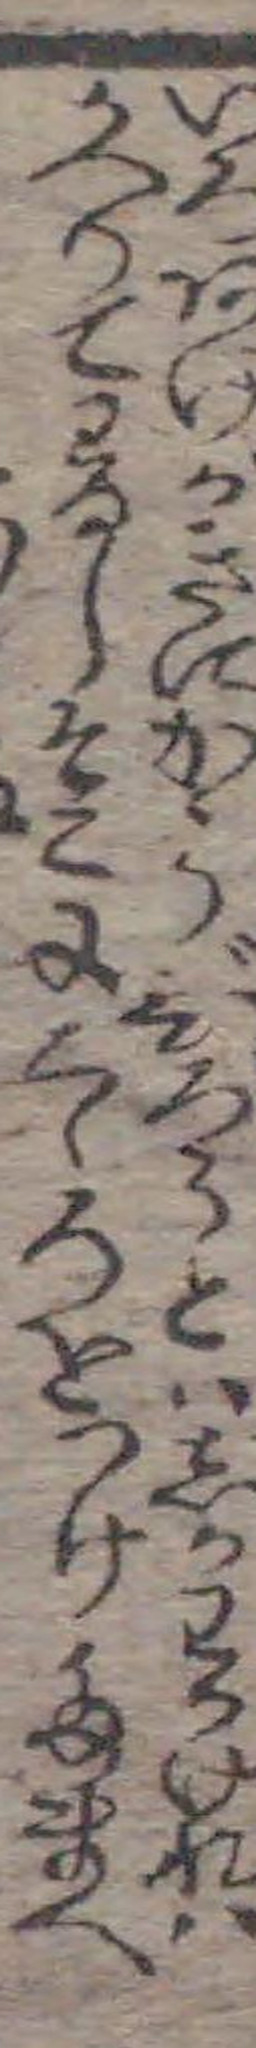かへりてわるしそこにこゝろをつけたまへ
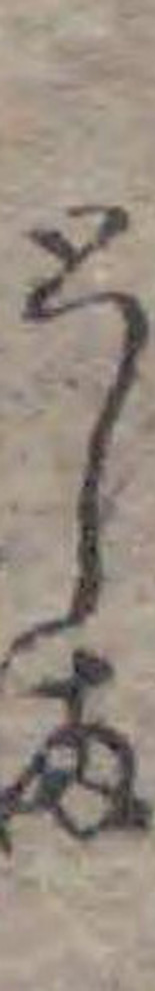としま
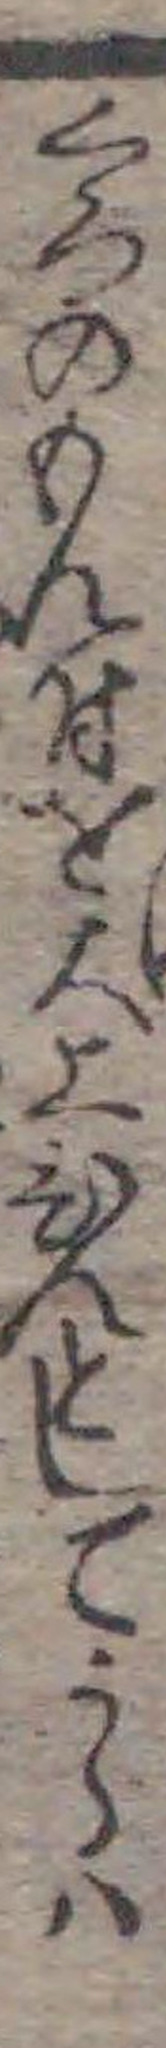くろのもん付を大上ひんとしてうらは
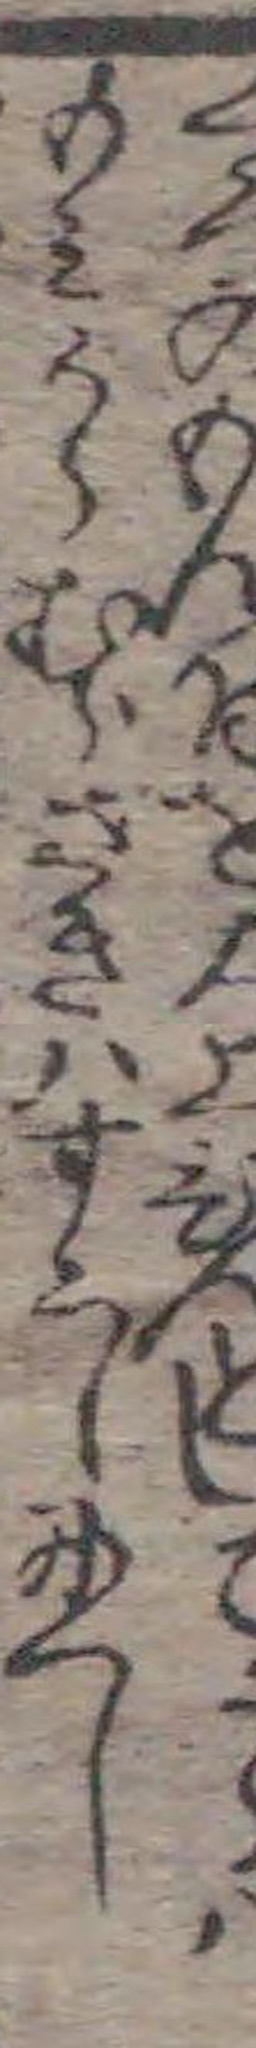もみうらむらさきはすこしにくし
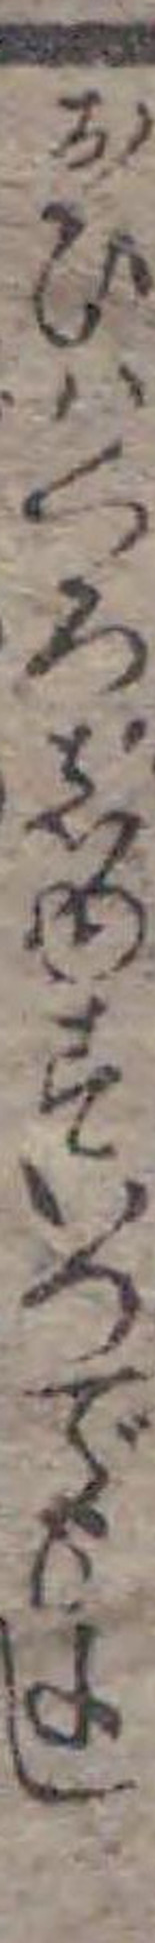おひはくろじゆすいつでもよし
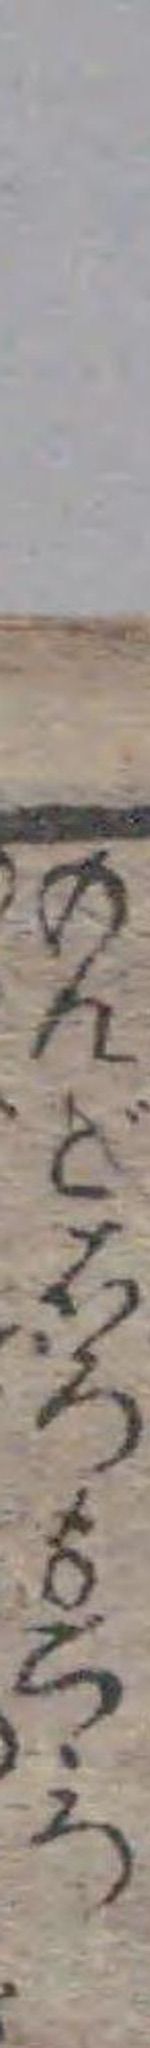もんどころもこゝろ
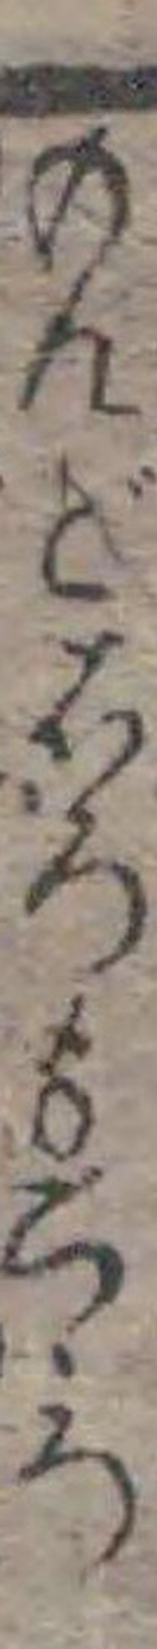もんどころもこゝろ
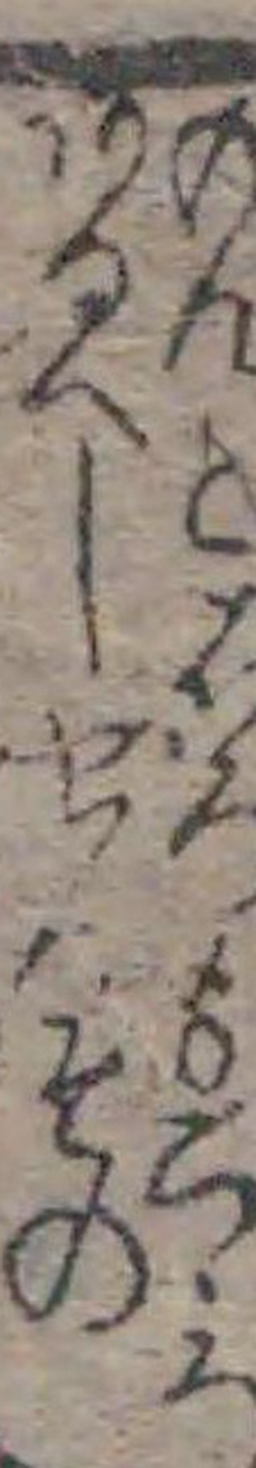あるへしせんその
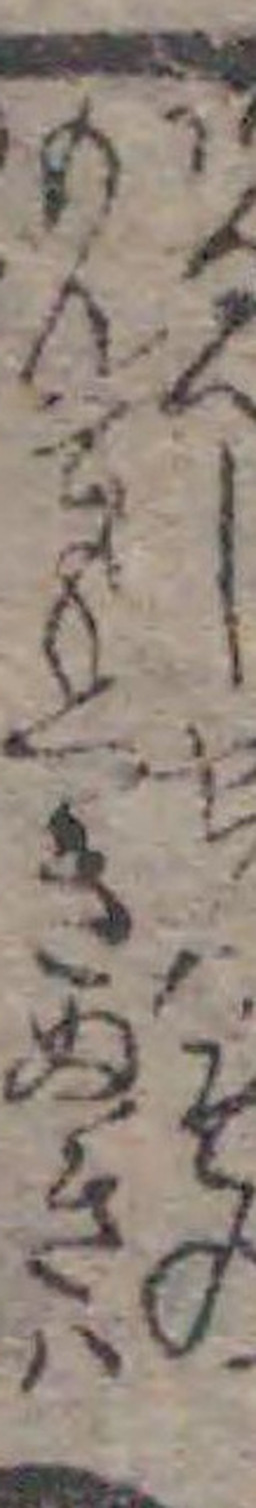もんてもくきぬきは
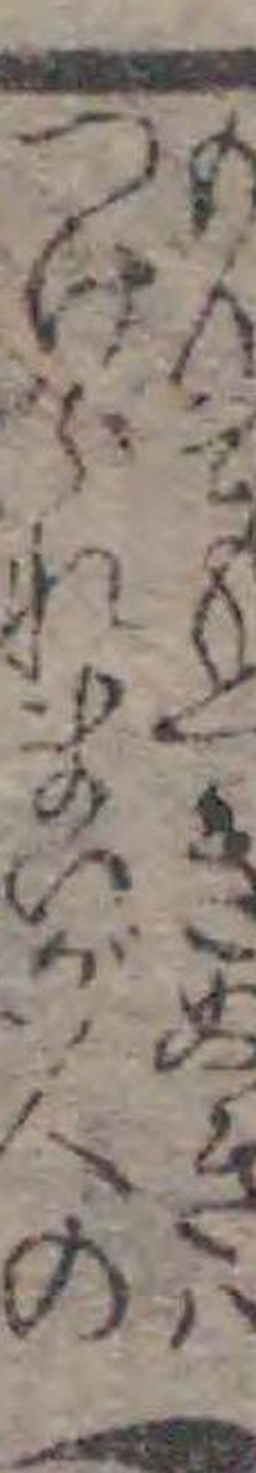つけられまいが人の
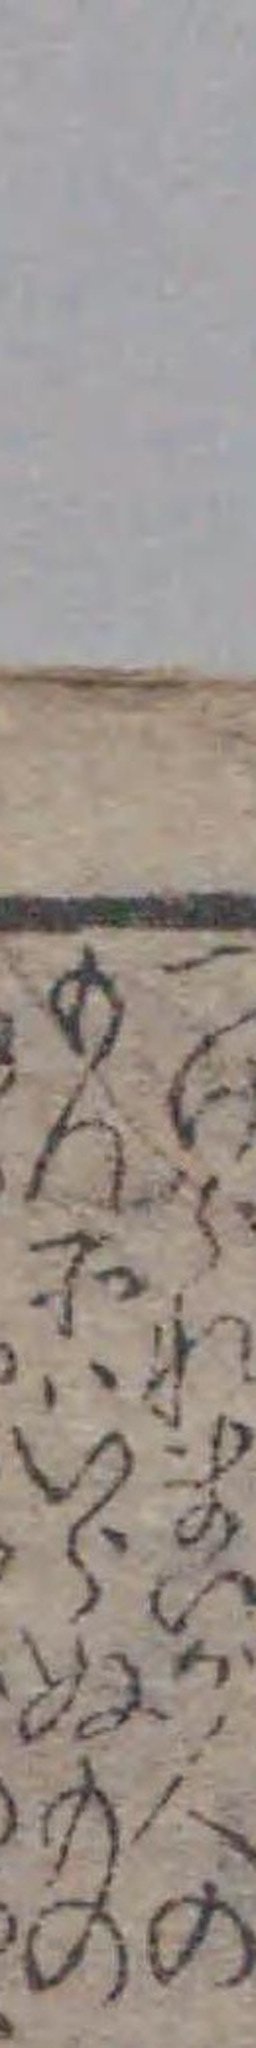もん所はいらぬもの
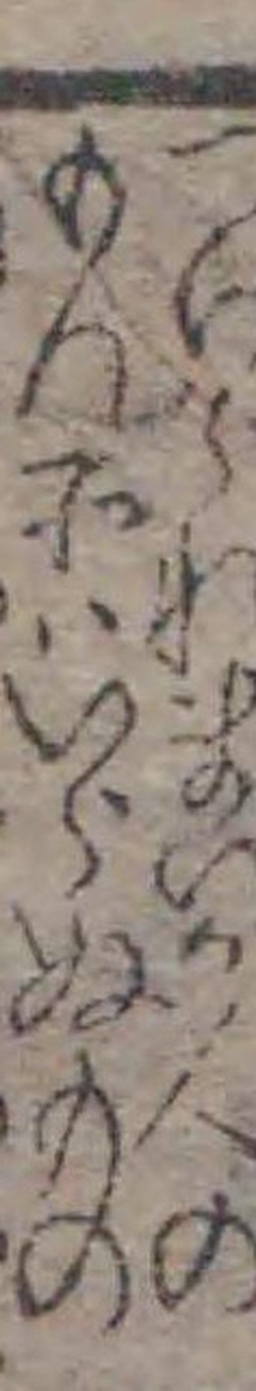もん所はいらぬもの
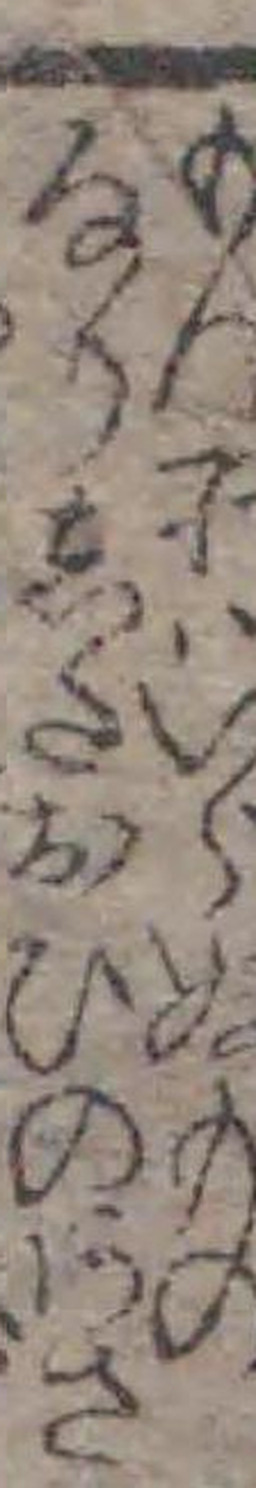なりしたおひのあさ
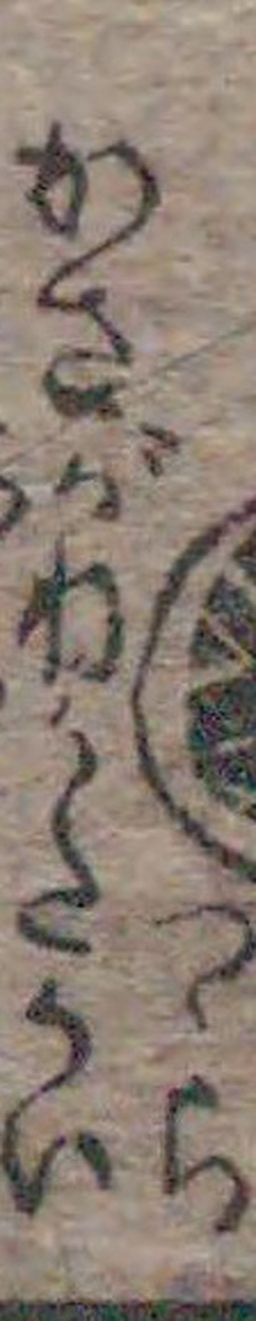かさがねかたかい
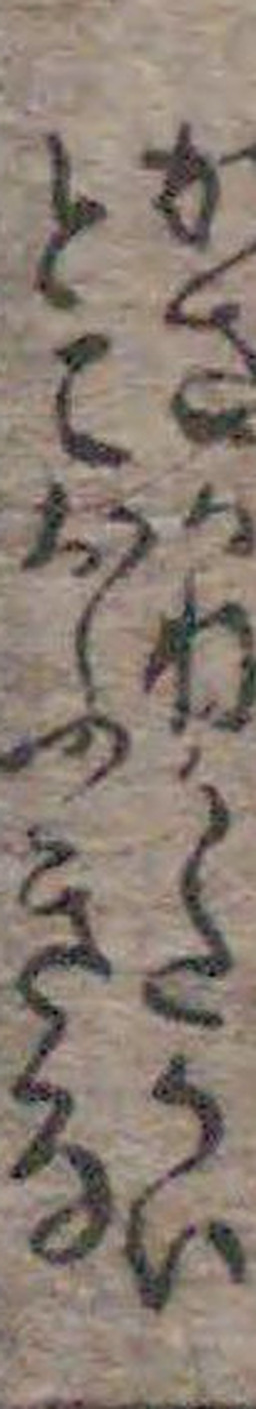とておふきな
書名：神田与吉一代記 : 3巻
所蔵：国立国会図書館 National Diet Library, JAPAN
